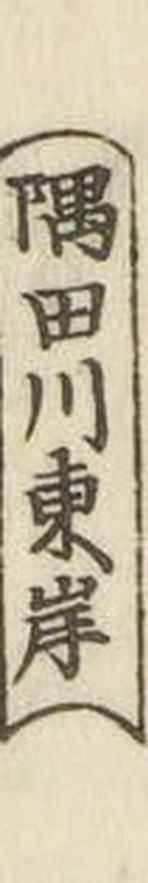隅田川東岸
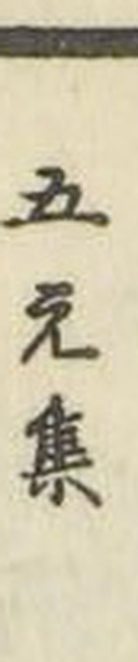五元集
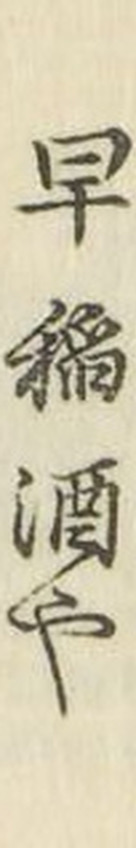早稲酒や
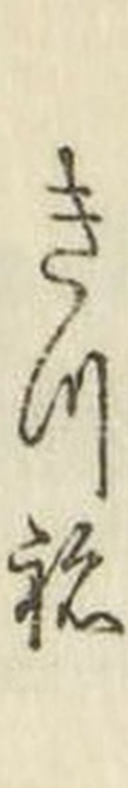きつね
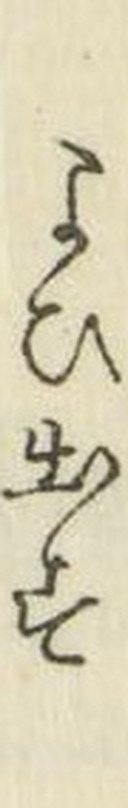よひ出す
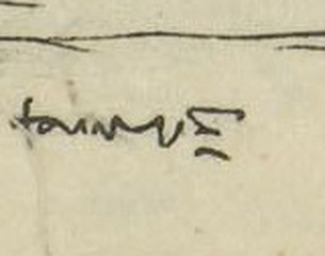すみた川

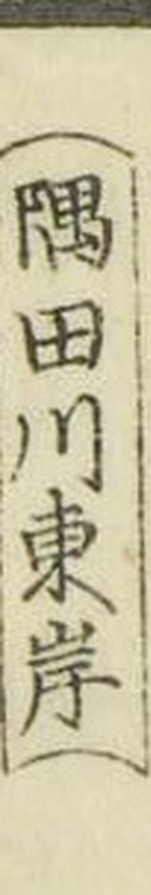隅田川東岸
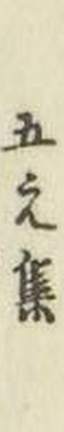五元集
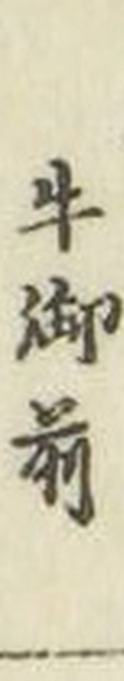牛御前
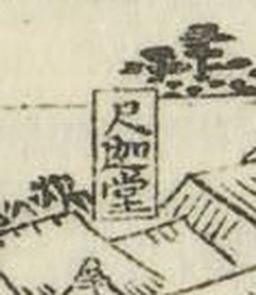尺迦堂
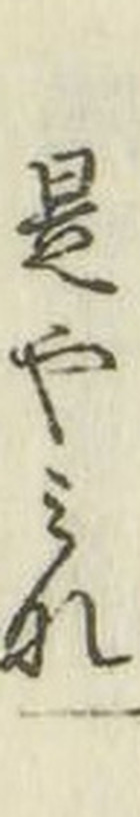是やみな

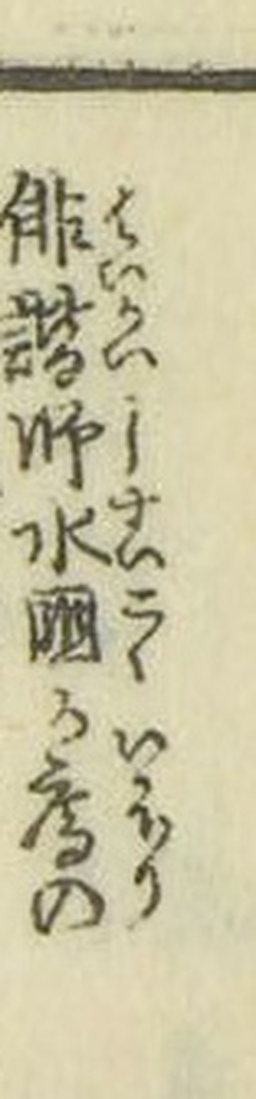俳諧師水国か庵の
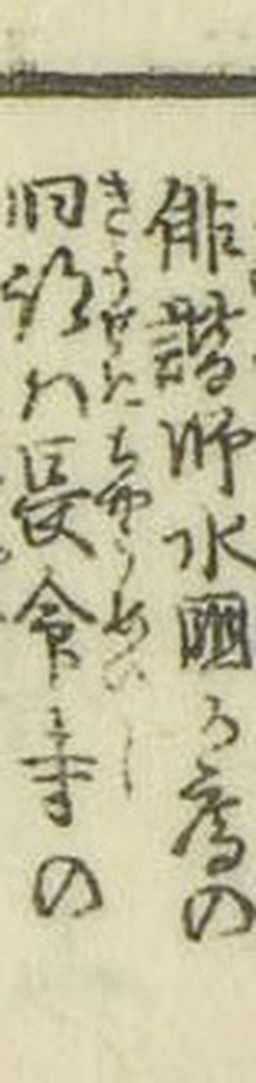旧跡は長命字の
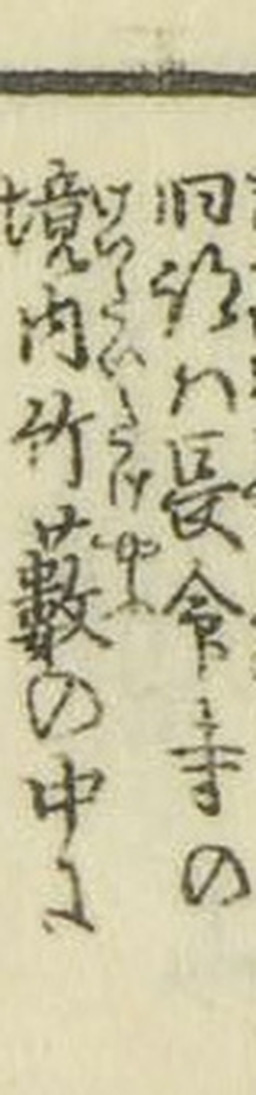境内竹薮の中に
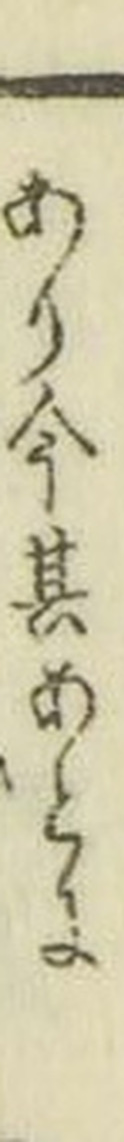あり今其あとに
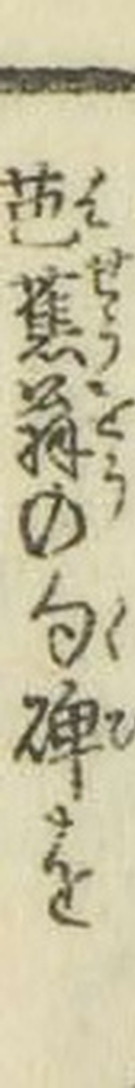芭蕉翁の句碑を
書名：江戸名所図会 20巻 巻之19
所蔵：東京学芸大学教育コンテンツアーカイブ
